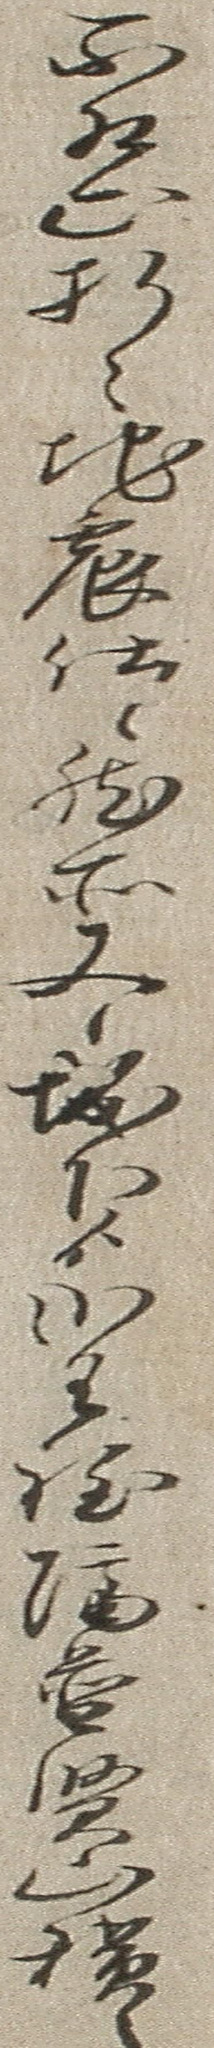不相止折々地震仕候然所又々城下ゟ弐里程隔普賢山続之
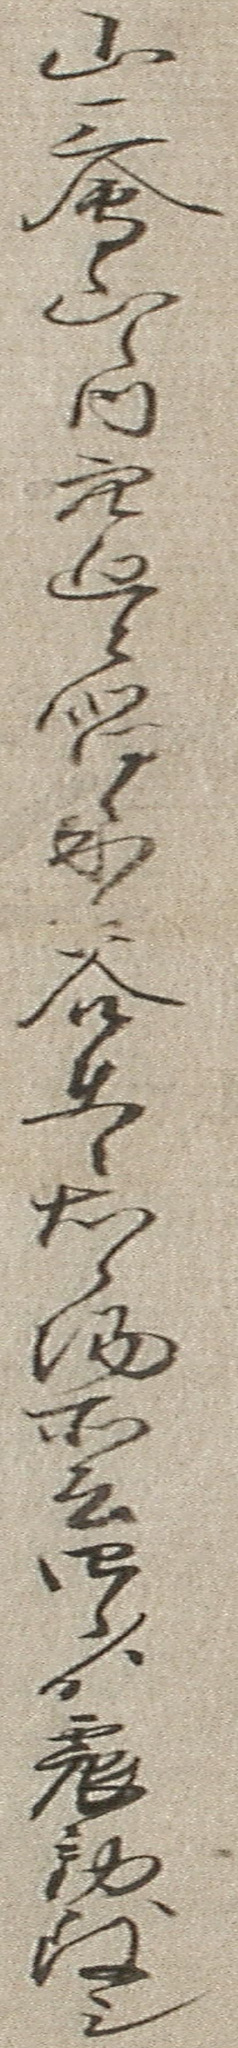山三会山之内穴廻と唱候所ニ谷在之右之湯所去四日ゟ震動致し
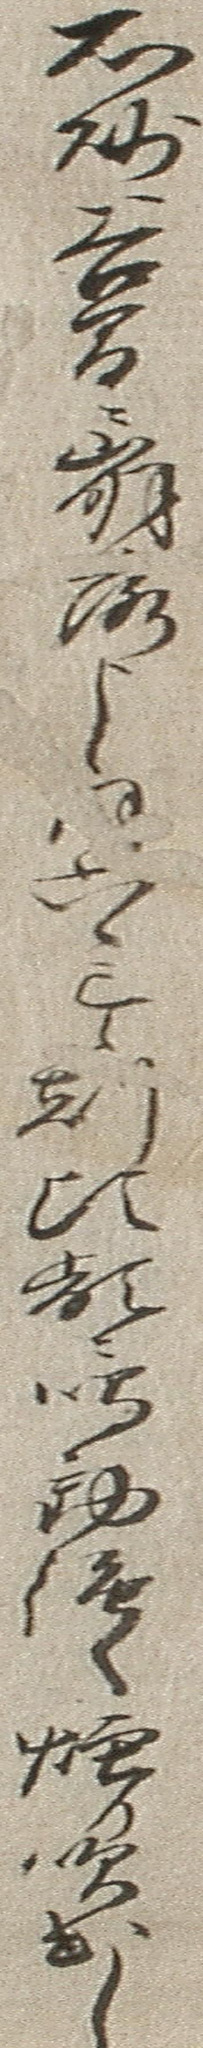石砂谷間に崩落申候同六日巳之刻比頻に鳴動強く煙り吹出し
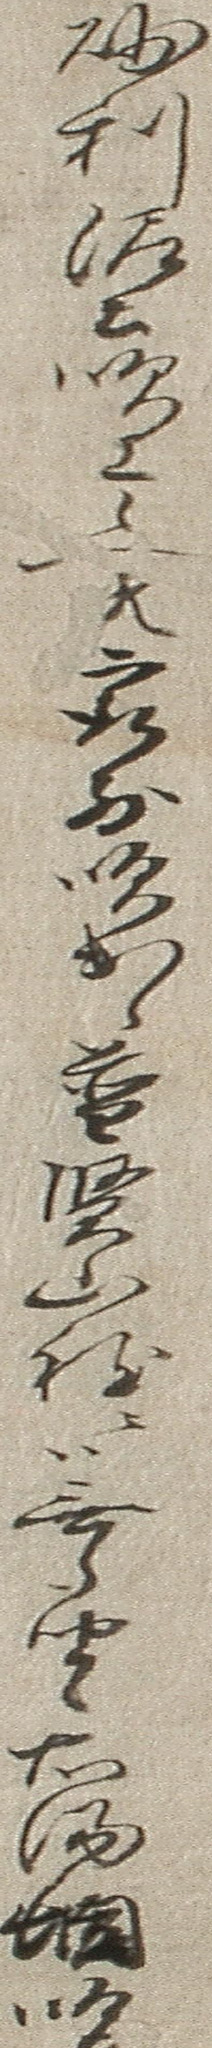砂利泥土吹上候へ共最前吹出候普賢山程には無御座候右湯烟吹
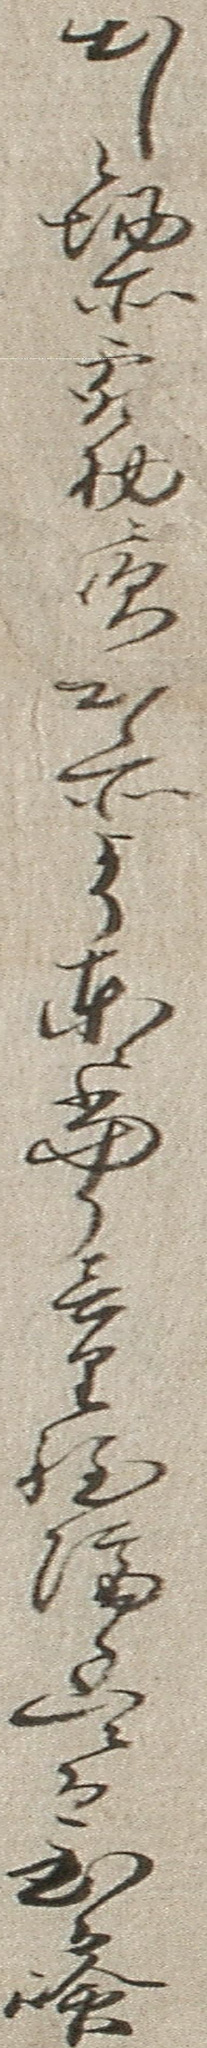出し候場所最初に吹出候所より東に当り壱里程隔候山に而至而嶮
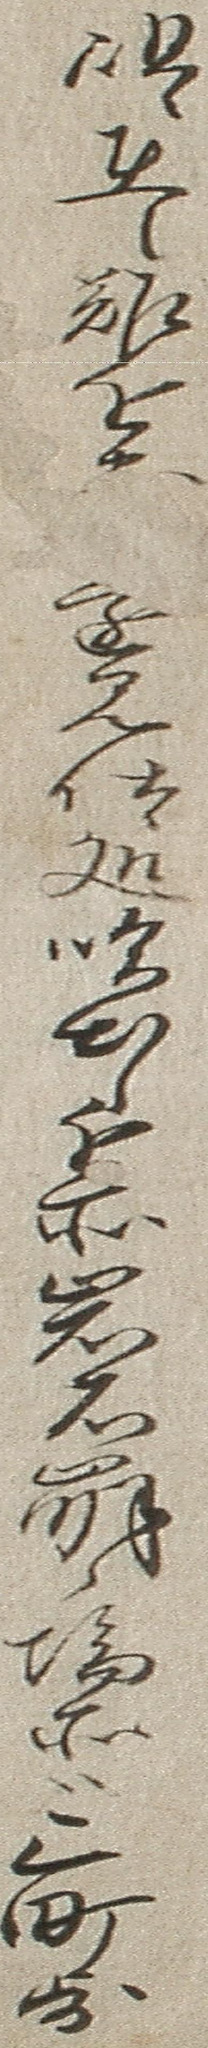岨に在之難近寄遠見仕候処吹出候近所岩石崩候場所は三町歩
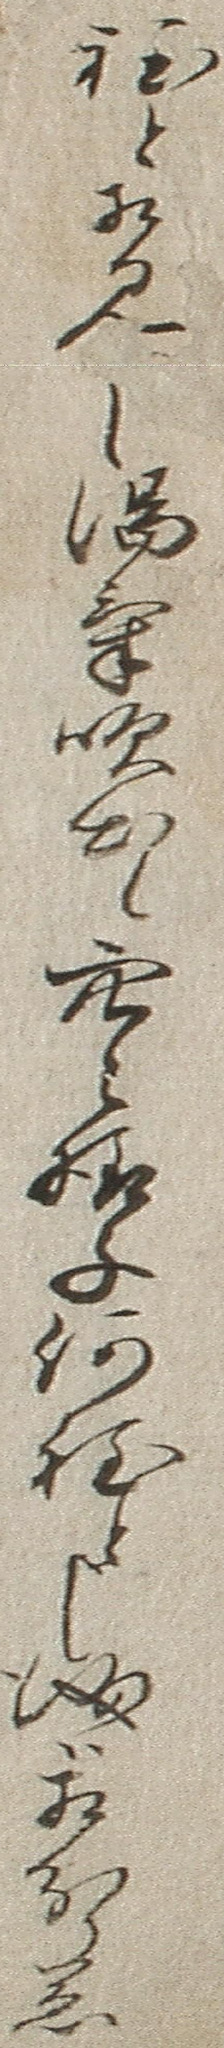程と相見申候湯気吹出候穴之様子何程と申儀は相分り兼
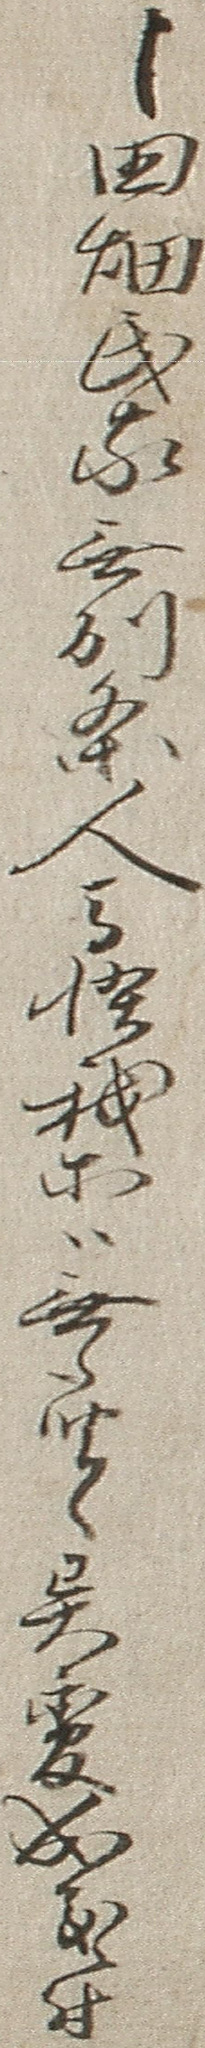申候田畑民家無別条人馬怪我等は無御座候異変成義に付
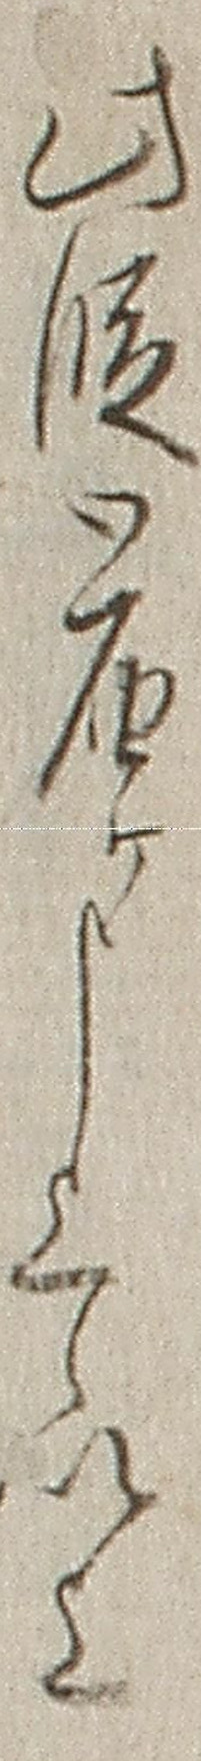此段御届け申上候以上

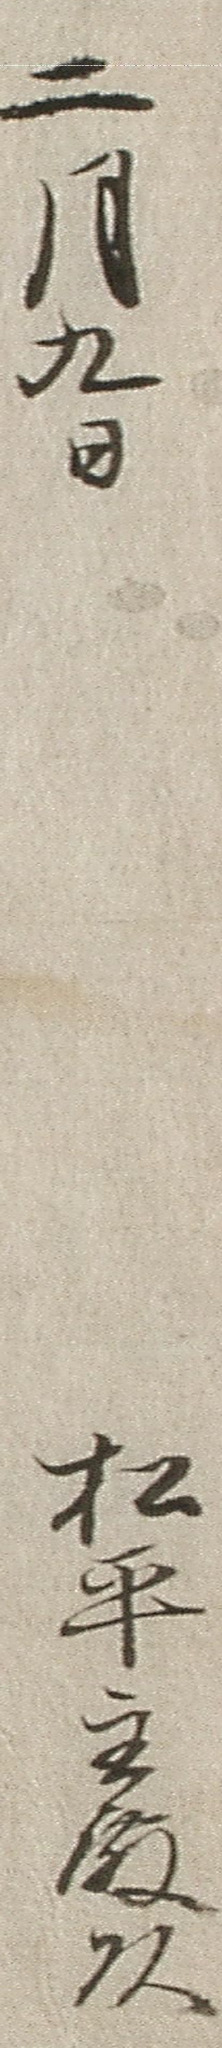二月九日松平主殿頭
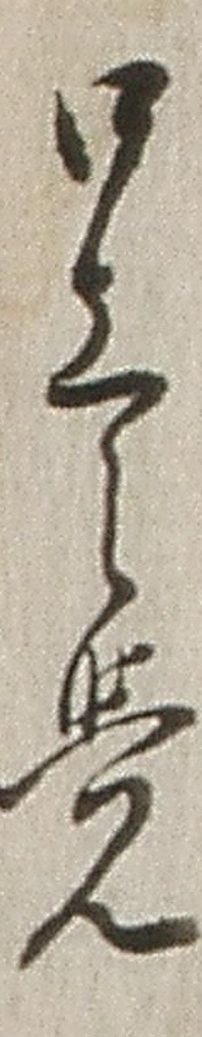口上之覚
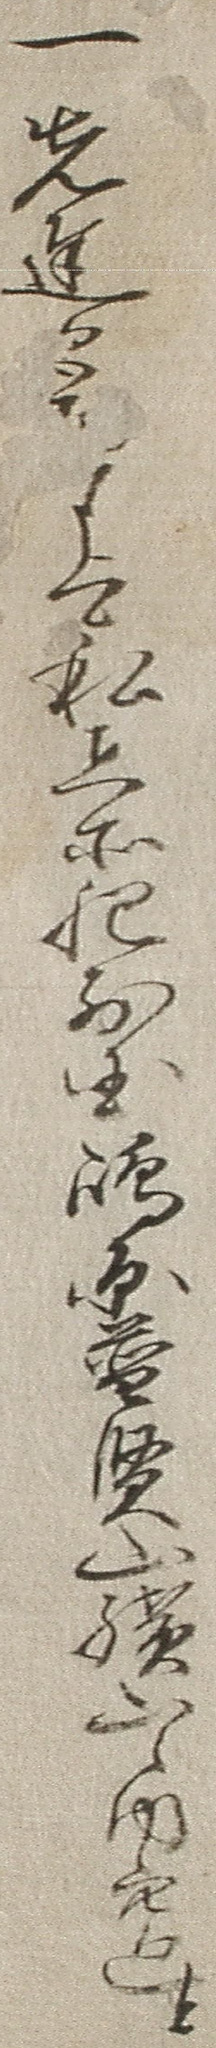一先達而御届申上候私在所肥前国島原普賢山続山之内穴廻と
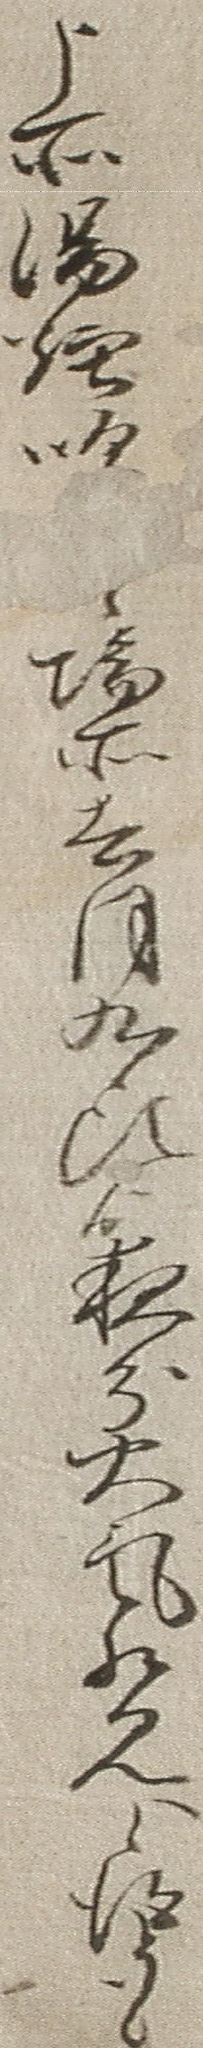申所湯煙吹出候場所去月九日頃ゟ夜分火気相見へ候得とも
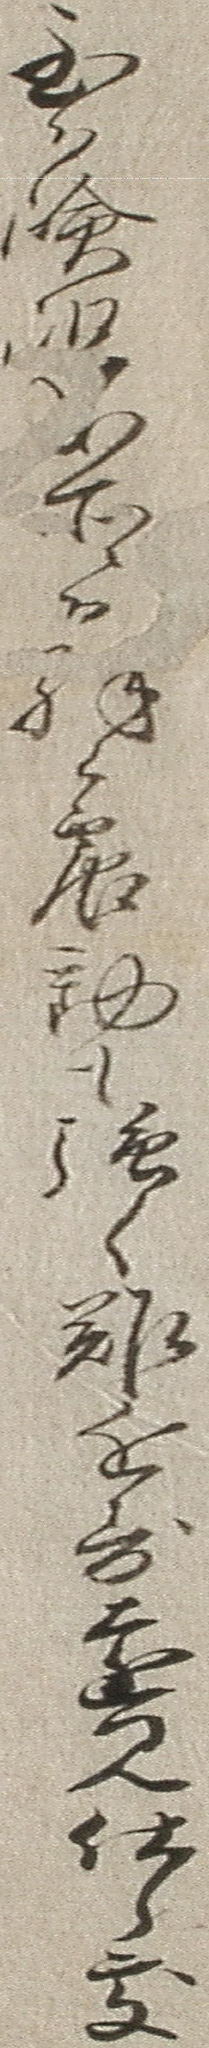至而嶮岨成所二而殊に震動も強く難近寄遠見仕候処
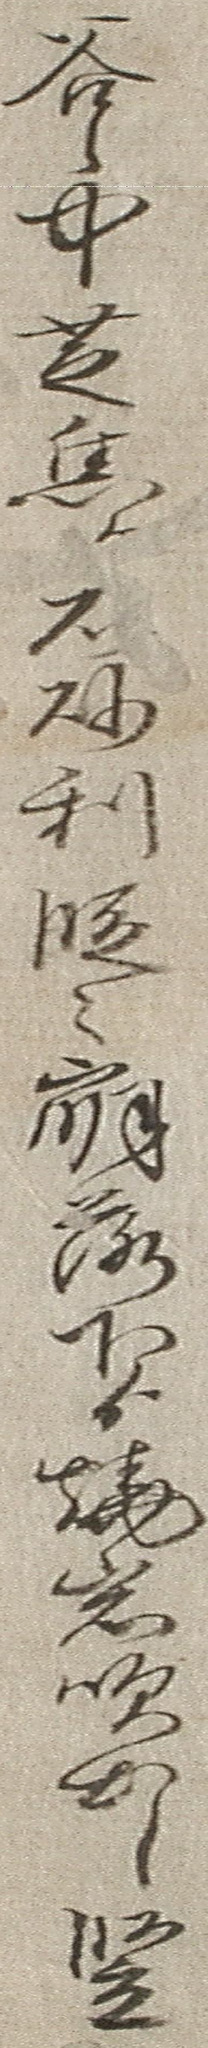谷中芝焦げ石砂利段々崩落下ゟ焼岩吹出し竪
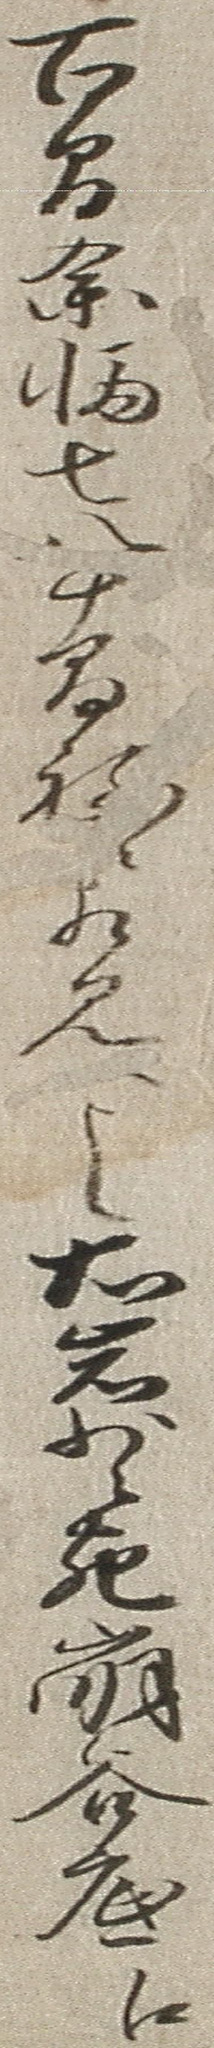百間余幅七八十間程に相見へ申候右岩少々宛崩谷底江
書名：太平秘録抜書　浅間山燒及普賢山崩
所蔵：東京大学地震研究所図書室 Earthquake Research Institute Library, The University of Tokyo, JAPAN
